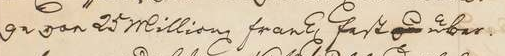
ge von 25 Millionen Franken fest zu über-
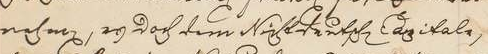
nehmen, es doch dem Nichtdeutschen Capitale,
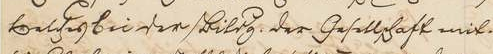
welches bei der Bildung der Gesellschaft mit-
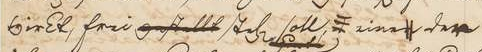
wirkt, frei gestellt stehen soll, d einer der
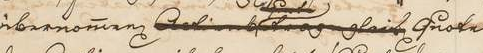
übernommenen Actienbetragequote gleichen Quote
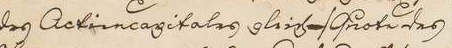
des Actiencapitales gleich-//kommende
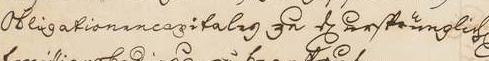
Obligationencapitales zu den ursprünglichen
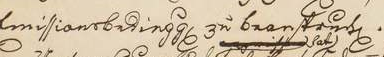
Emissionsbedingungen zu beanspruchen.
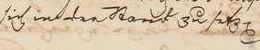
sich in den Stand zu setzen,
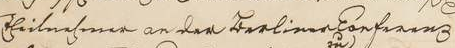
Theilnehmer an der Berliner Conferenz
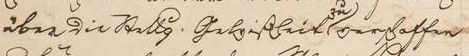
über die Stellg. Gewißheit zu verschaffen
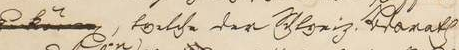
zu können, welche der Schweiz. Bdsrath
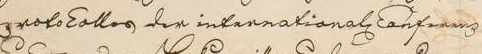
protokolles der internationalen Conferenz
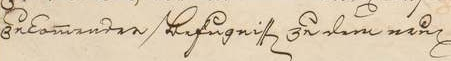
zukommenden Befugnissen zu dem neuen
